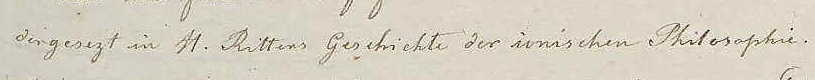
dergesezt in H. Ritters Geschichte der ionischen Philosophie.
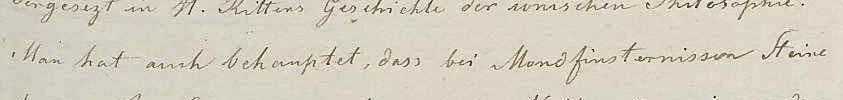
Man hat auch behauptet, dass bei Mondfinsternissen Steine
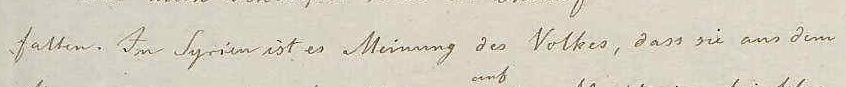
fallen. In Syrien ist es Meinung des Volkes, dass sie aus dem
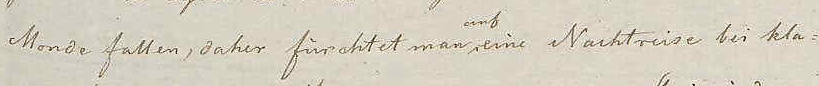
Monde fallen, daher fürchtet man auf Nachtreise bei kla-
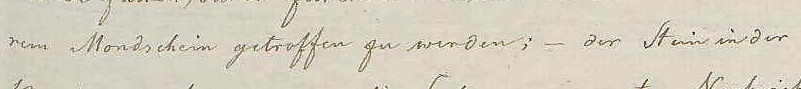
rem Mondschein getroffen zu werden; – der Stein in der
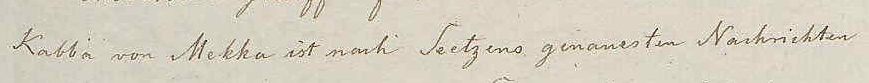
Kabba von Mekka ist nach Seetzens genauesten Nachrichten
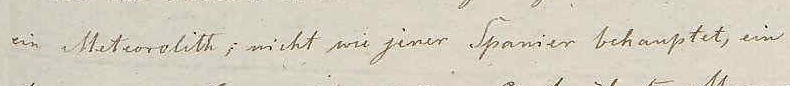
ein Meteorolith; nicht wie jener Spanier behauptet, ein
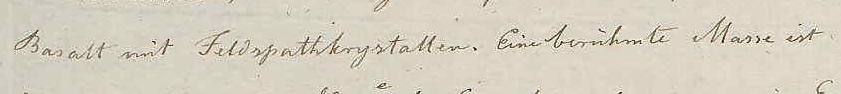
Basalt mit Feldspathkrystallen. Eine berühmte Masse ist
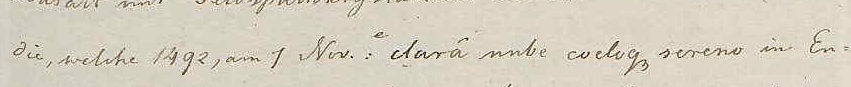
die, welche 1492, am 7 Nov.: e clará unbe coeloq￼ sereno in En-
